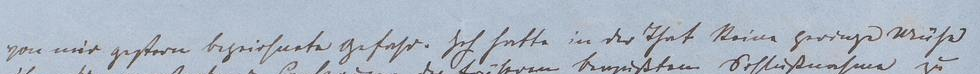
von mir gestern bezeichnete Gefahr. Ich hatte in der That keine geringe Mühe
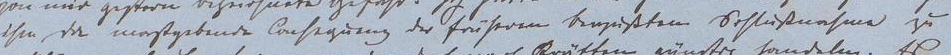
ihm die maßgebende Consequenz der früheren bewußten Schlußnahme zu
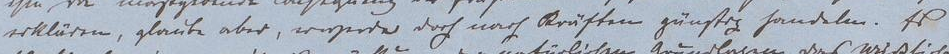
erklären, glaube aber, er werde doch nach Kräften günstig handeln. Es
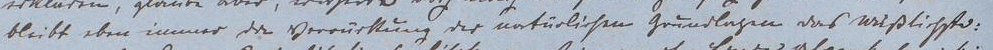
bleibt eben immer die Verrückung der natürlichen Grundlagen das Mißlichste:
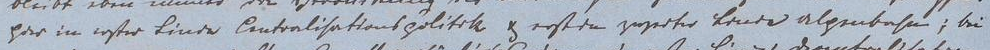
hier in erster Linie Centralisationspolitik & erst in zweiter Linie Alpenbahn; bei
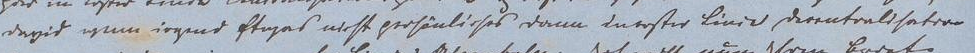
David wenn irgend Etwas nicht persönliches dann in erster Linie Decentralisation
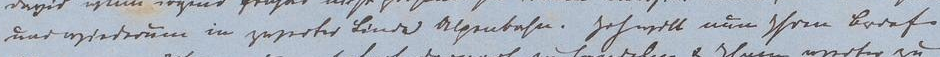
und wiederum in zweiter Linie Alpenbahn. Ich will nun Ihren Brief
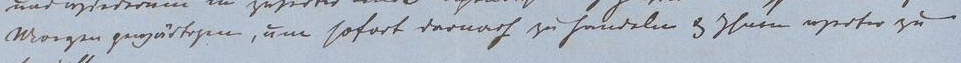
Morgen gewärtigen, um sofort darnach zu handeln & Ihnen weiter zu
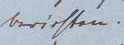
berichten.
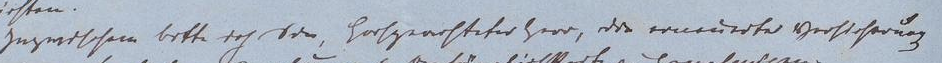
Inzwischen bitte ich Sie, hochgeehrter Herr, die erneuerte Versicherung
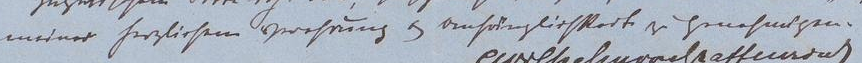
meiner herzlichen Verehrung & Anhänglichkeit zu genehmigen.
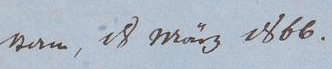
Bern, 18 März 1866.
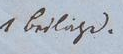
1 Beilage.
